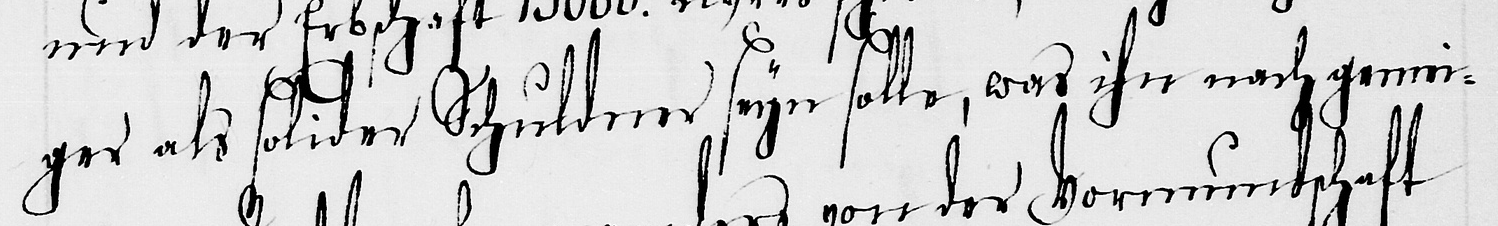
iger als solider Schuldner seyn solle, was ihn nach gemei¬
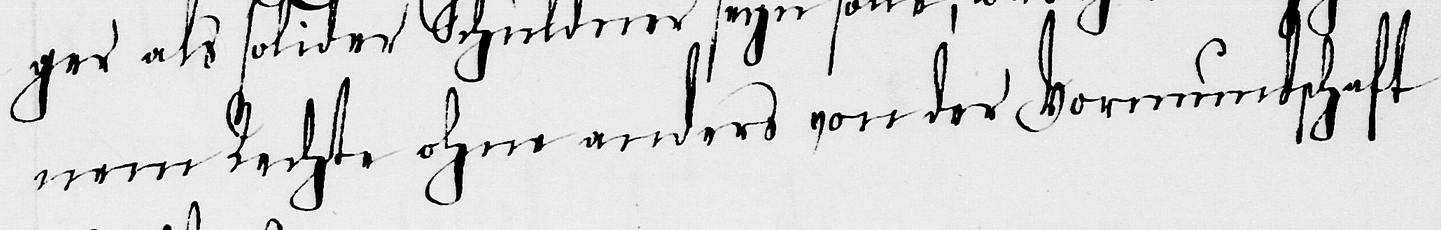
nen Rechte ohne anders von der Vormundschaft
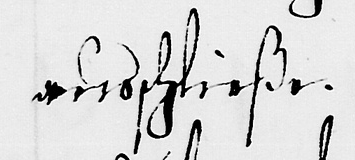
ausschließe.
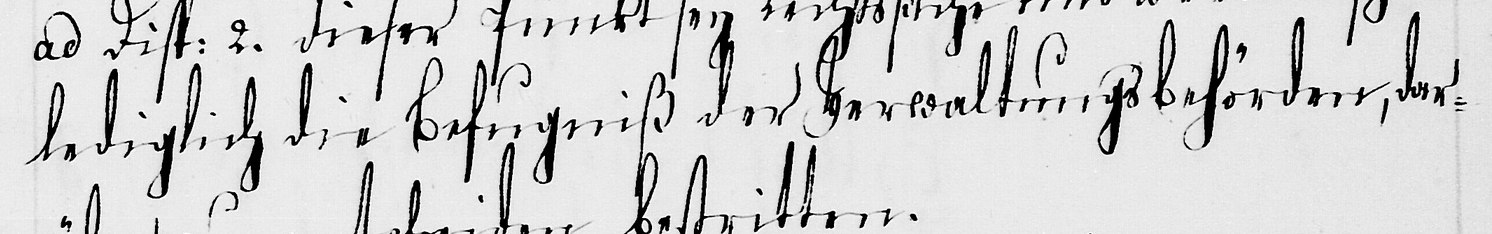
lediglich die Befugniß der Verwaltungsbehörden, dar¬
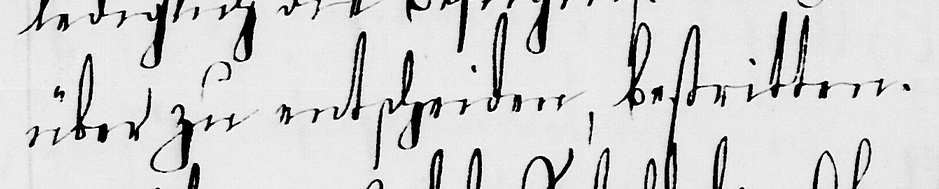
über zu entscheiden, bestritten.
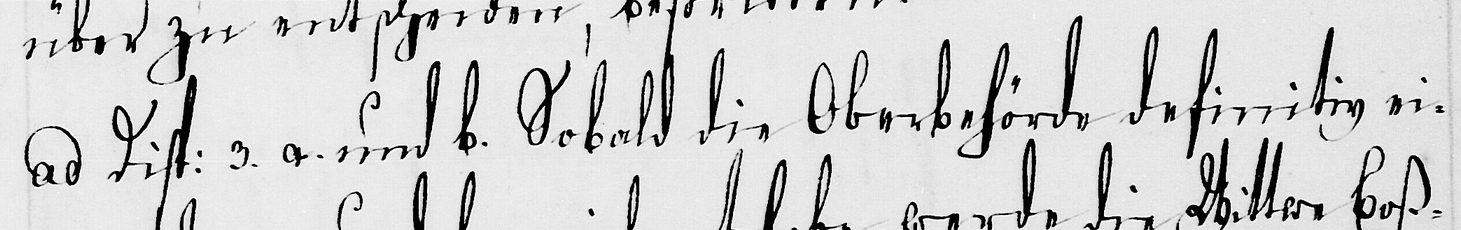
3. a. und b. Sobald die Oberbehörde definitiv ei¬
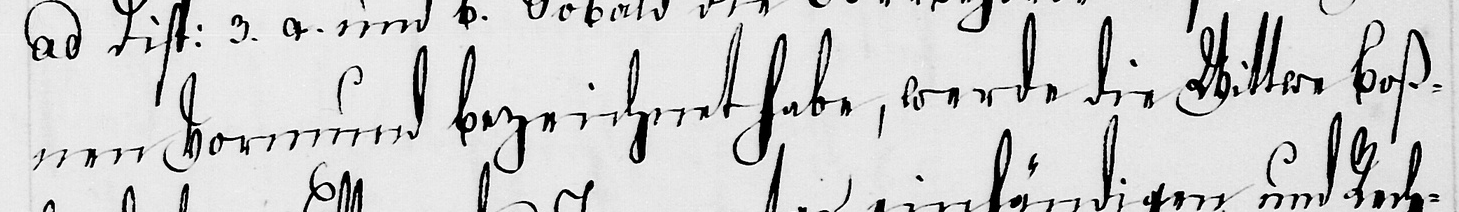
nen Vormund bezeichnet habe, werde die Wittwe Boß¬
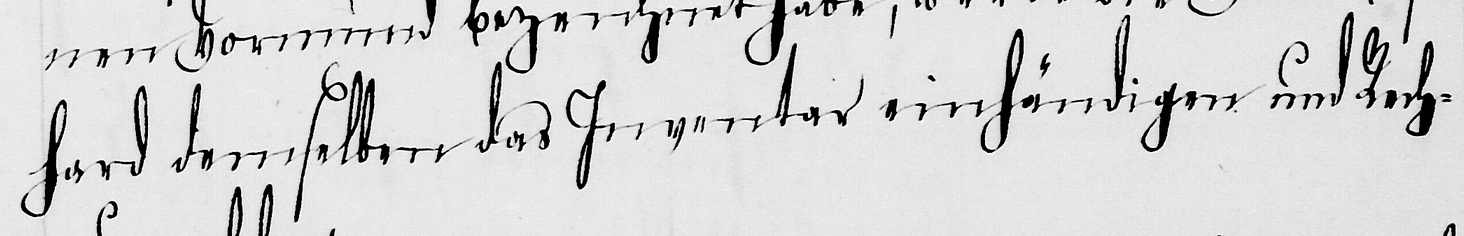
hard demselben das Inventar einhändigen und Rech¬
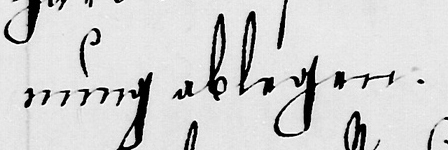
nung ablegen.
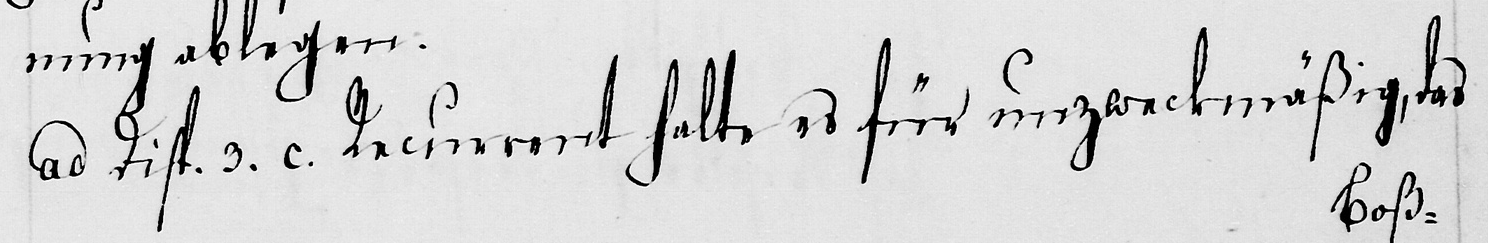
ad Disp. 3. c. Recurrent halte es für unzweckmäßig, das
